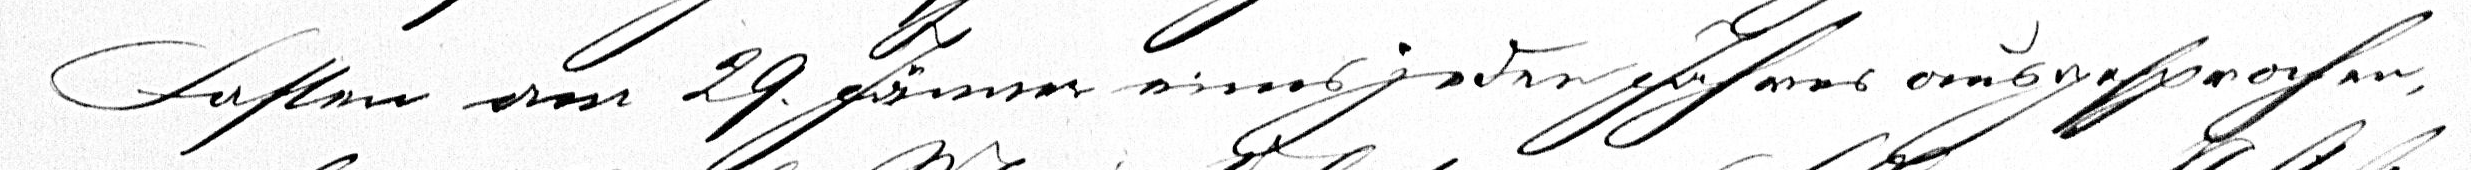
Fasten am 29. Jänner eines jeder Jahres ausgesprochen,
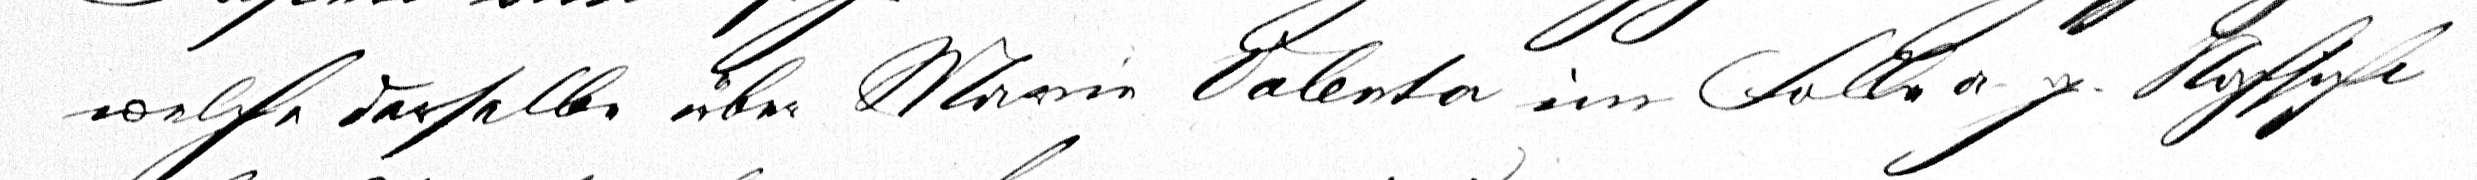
welche derselbe über Marie Valenta in Folle a. g. Nahsicht
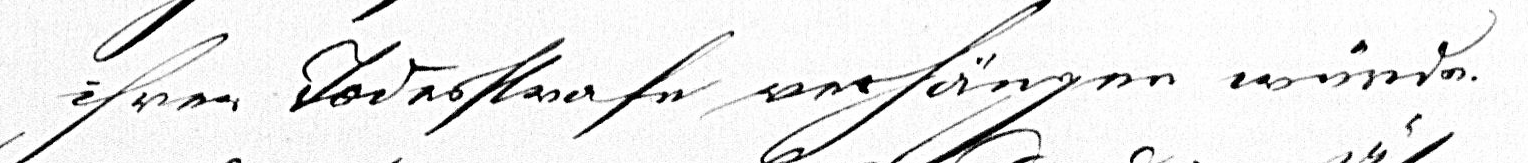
ihren Todesstrafe verhängen würde.
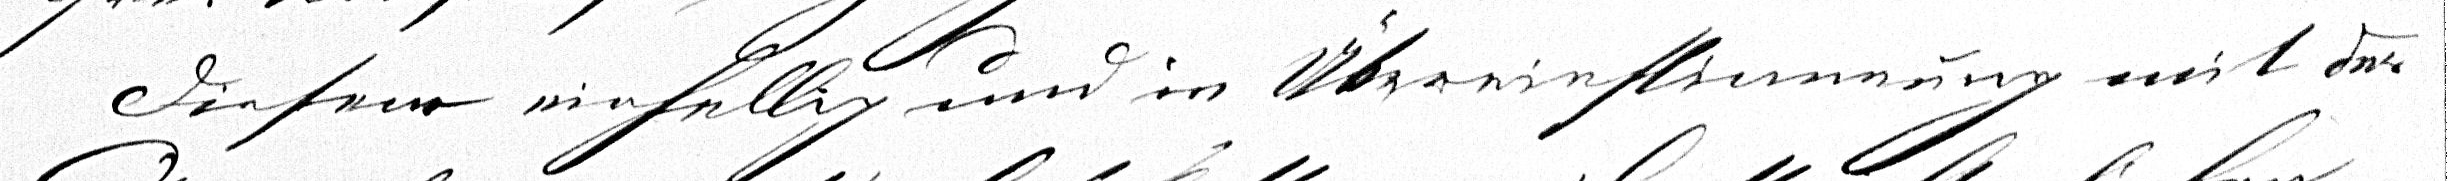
Diesem einhellig und in Übereinstimmung mit der
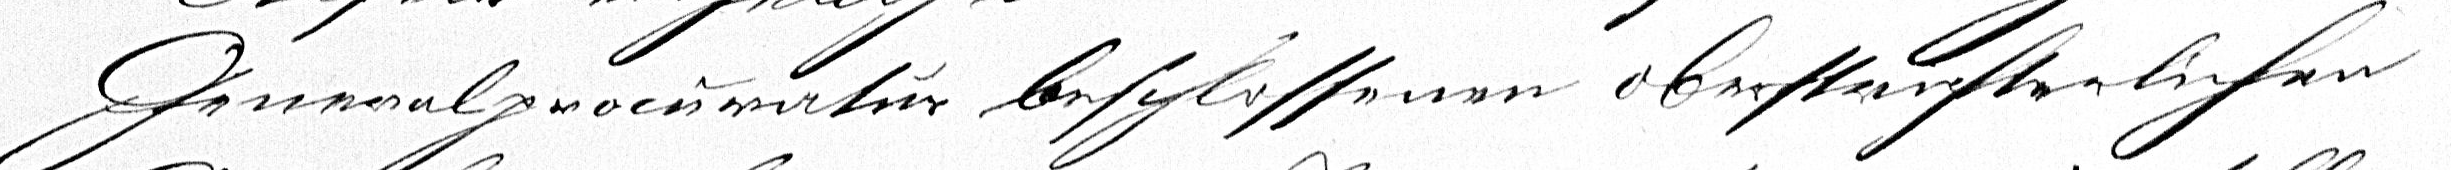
Generalprocuratur beschlossenen oberstrichterlichen
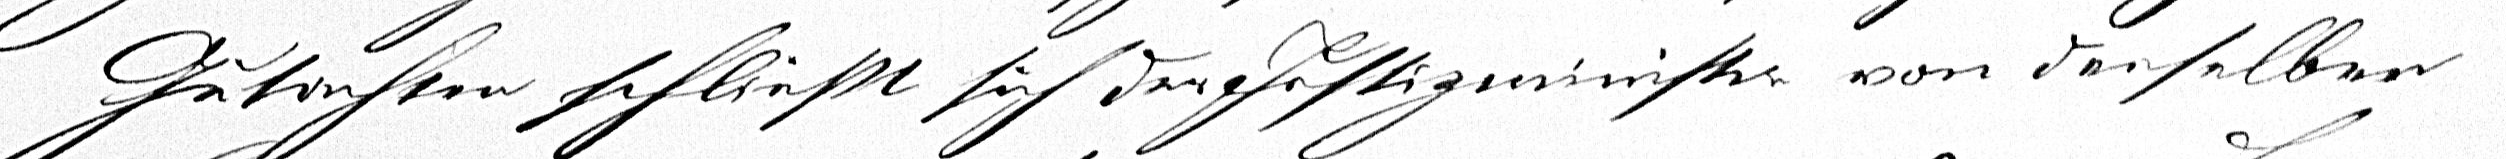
Gutachten schließt sich der Justizminister von derselben
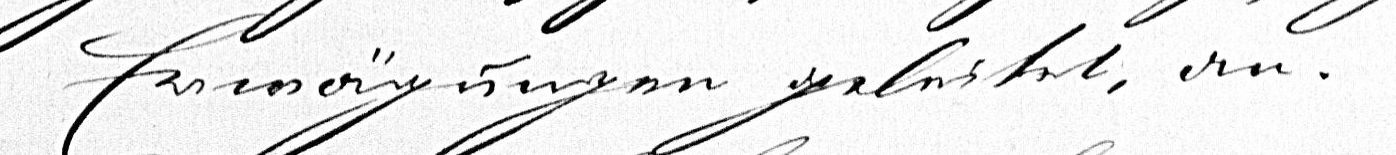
Erwägungen geleitet, an.
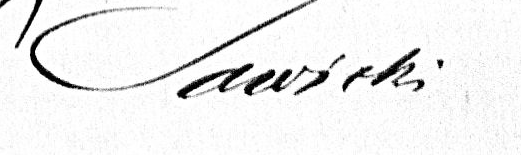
Sawicki
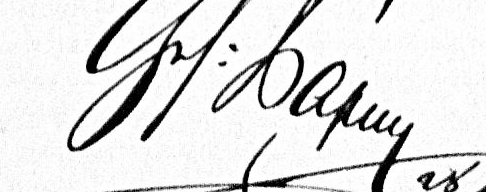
Ges: Baipuy
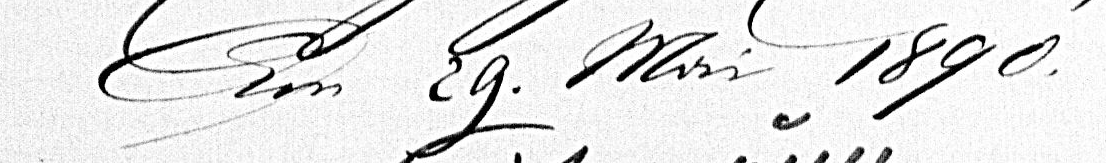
Am 29. Mai 1890.
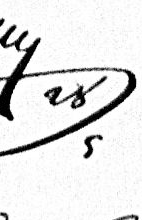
28/5
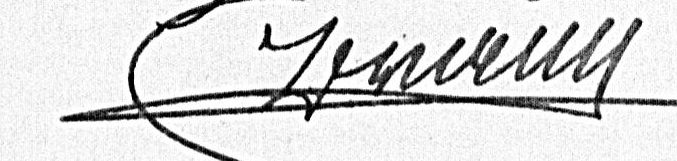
xx
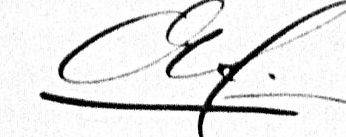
Af.
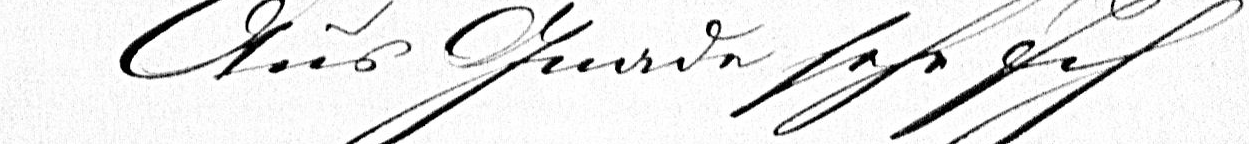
Aus Gnade sehr Ich
